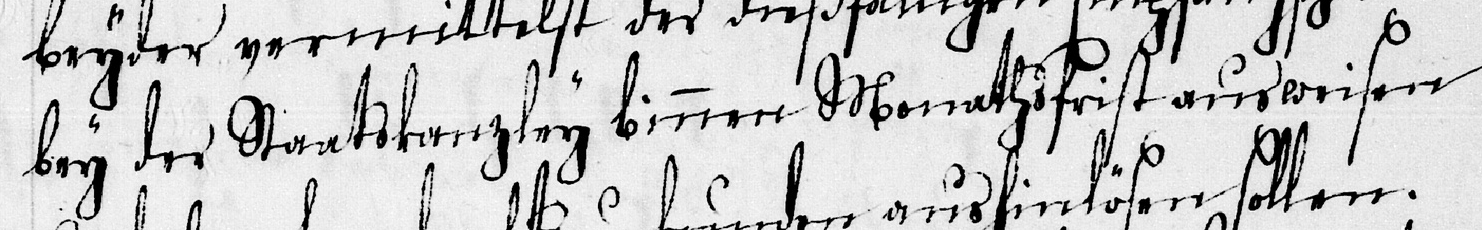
bey der Staatskanzley binnen Monathsfrist ausweisen
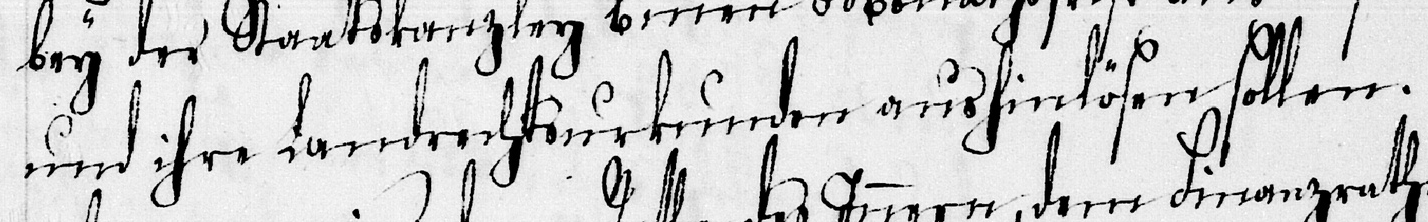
und ihre Landrechtsurkunden aushinlösen sollen.
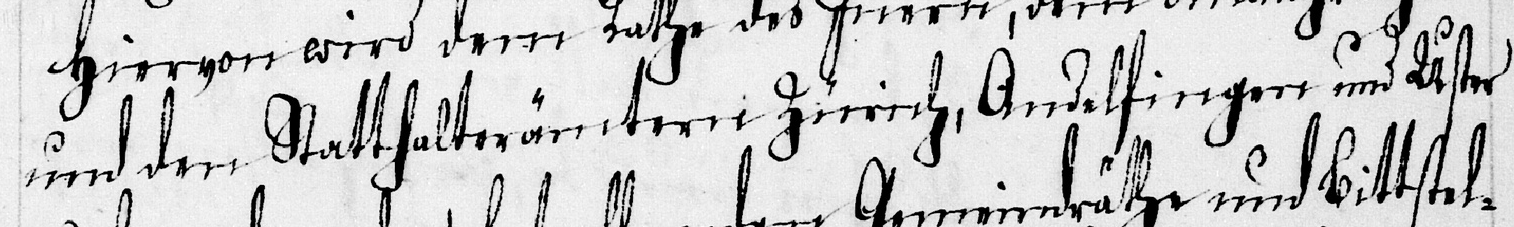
und den Statthalterämtern Zürich, Andelfingen und Uster
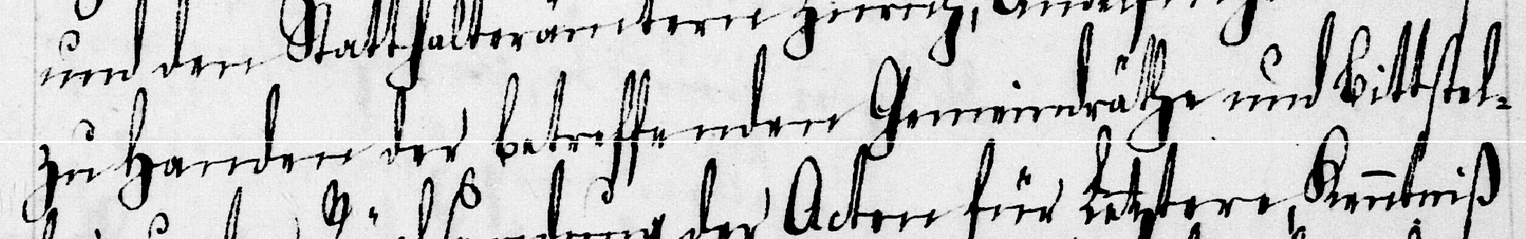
zu Handen der betreffenden Gemeindräthe und Bittstel¬
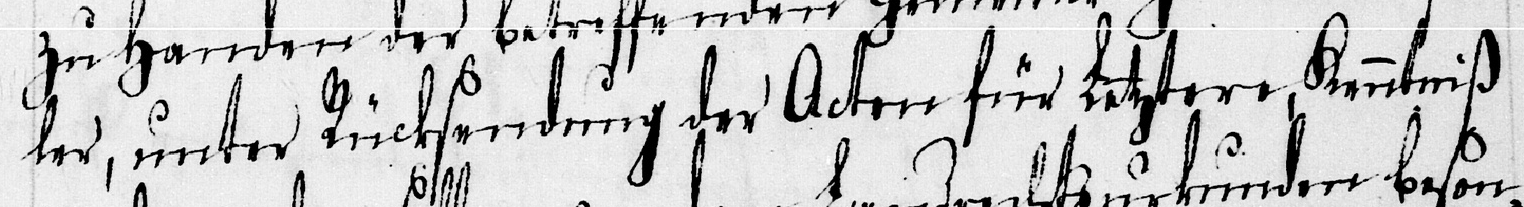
ler, unter Rückforderung der Acten für Letztere, Kenntniß
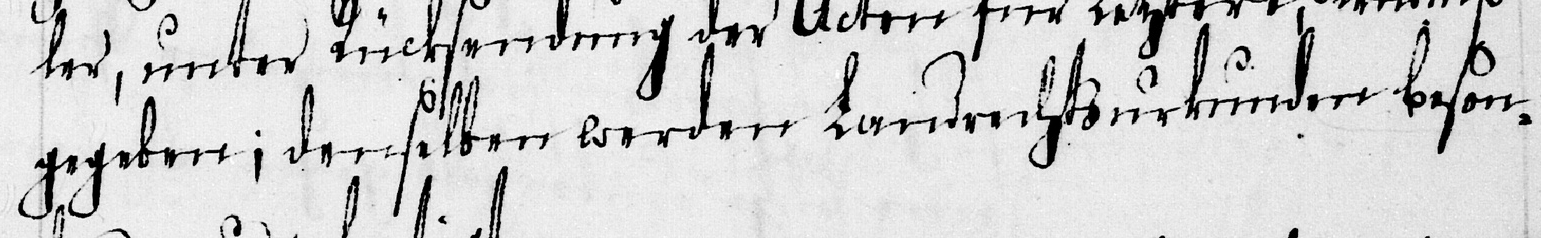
gegeben; denselben werden Landrechtsurkunden beson¬
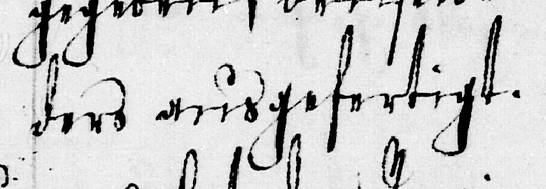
ders ausgefertigt.
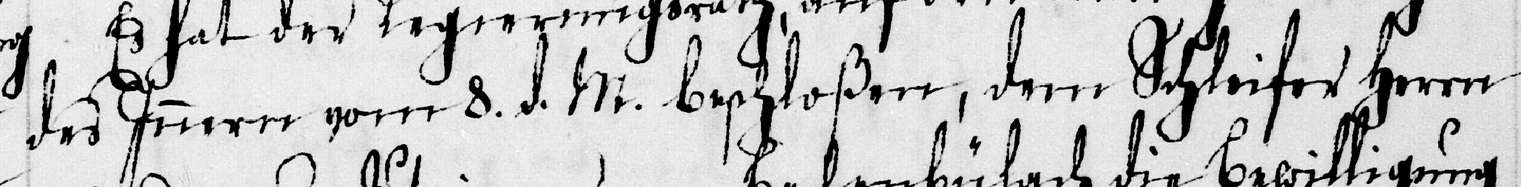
des Innern vom 8. d. M. beschloßen, dem Schleifer Herrn
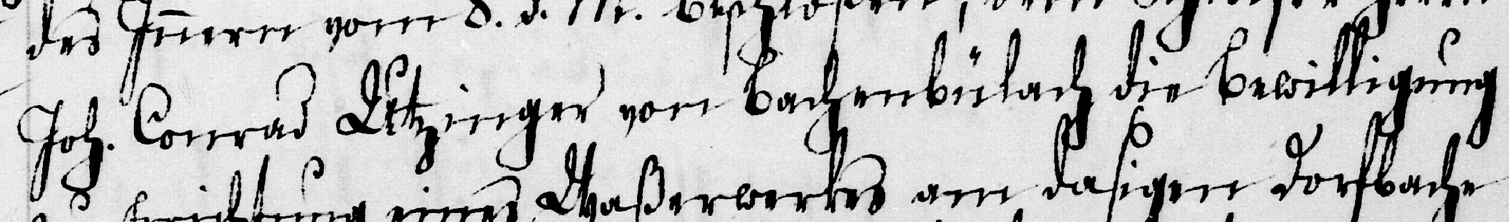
Joh. Conrad Utzinger von Bachenbülach die Bewilligung
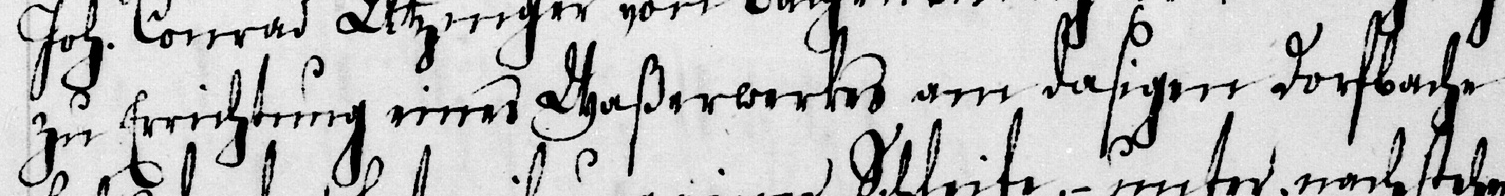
zu Errichtung eines Waßerwerkes am dasigen Dorfbache
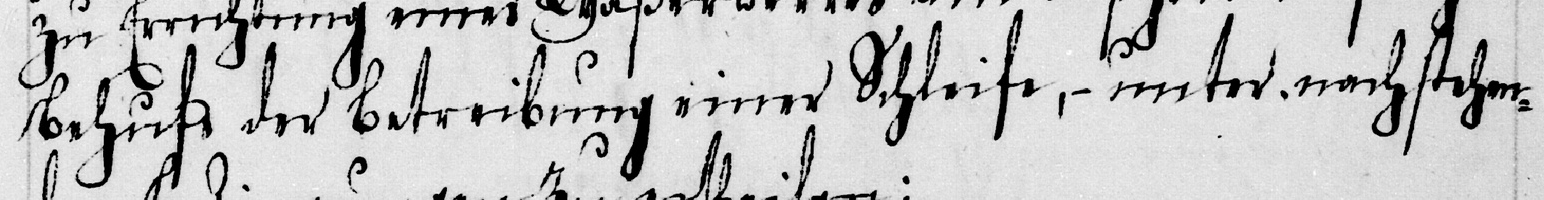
Behufs der Betreibung einer Schleife,– unter nachstehen¬
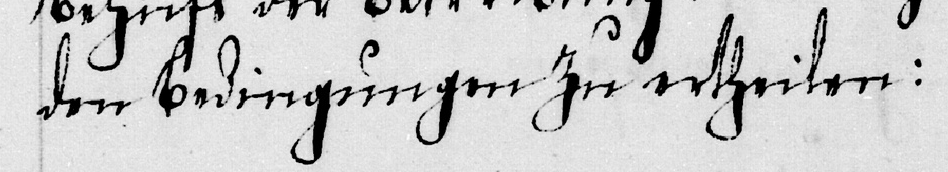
den Bedingungen zu ertheilen:
